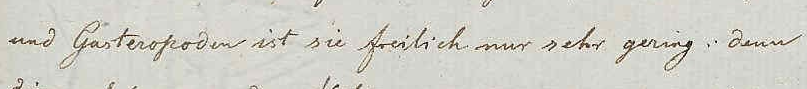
und Gasteropoden ist sie freilich nur sehr gering: denn
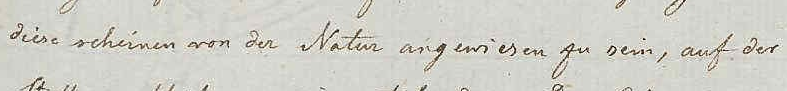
diese scheinen von der Natur angewiesen zu sein, auf der
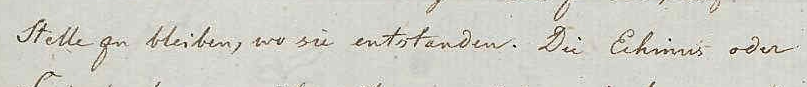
Stelle zu bleiben, wo sie entstanden. Die Echinus oder
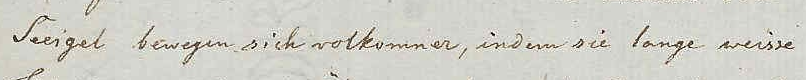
Seeigel bewegen sich volkomner, indem sie lange weisse
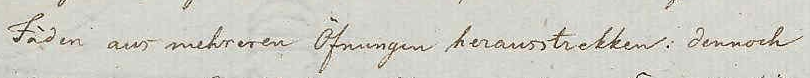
Fäden aus mehreren Öfnungen herausstrekken: dennoch
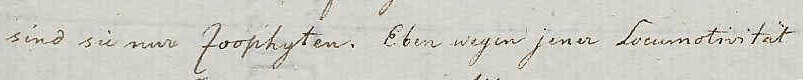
sind sie nur Zoophyten. Eben wegen jener Locumotivität
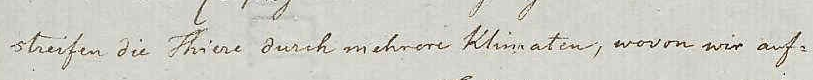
streifen die Thiere durch mehrere Klimaten, wovon wir auf-
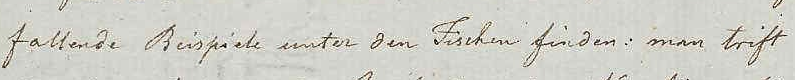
fallende Beispiele unter den Fischen finden: man trift
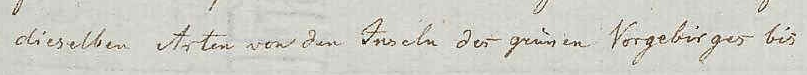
dieselben Arten von den Inseln des grünen Vorgebirges bis
